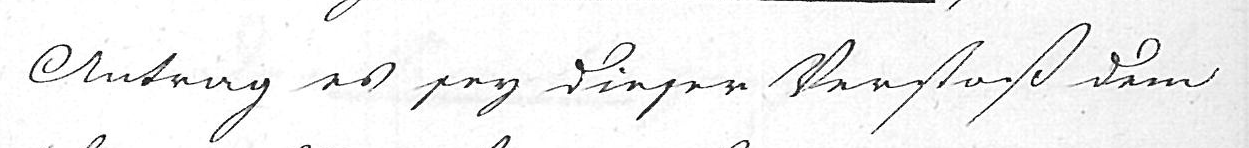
Antrag es sey dieser Verstoß dem
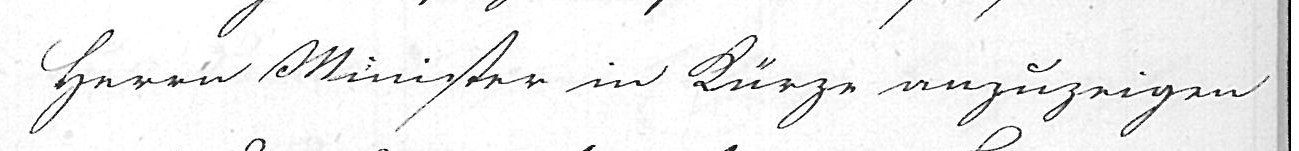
Herrn Minister in Kürze anzuzeigen
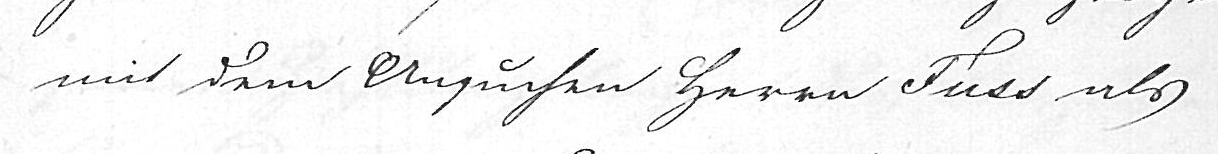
mit dem Ansuchen Herrn Fuss als
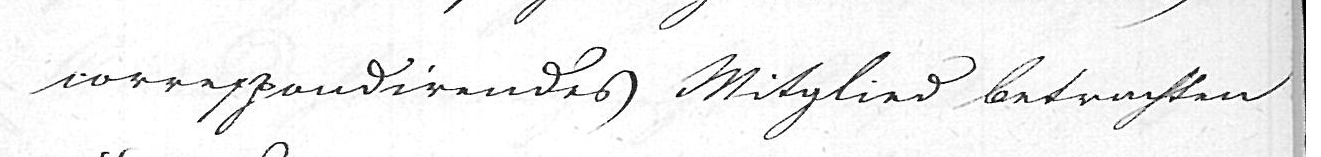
correspondirendes Mitglied betrachten
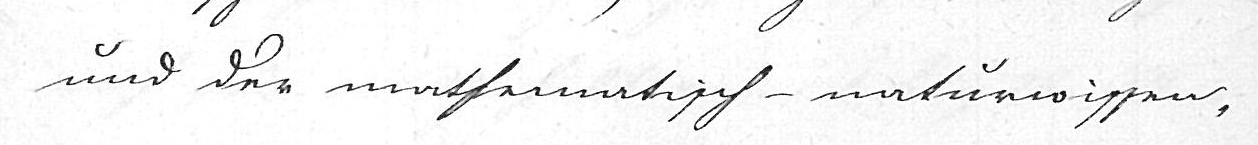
und der mathematisch-naturwissen-
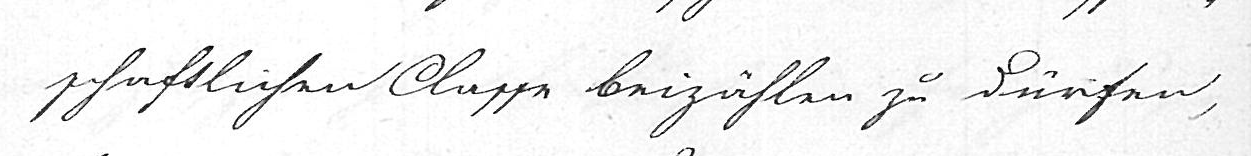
schaftlichen Classe beizählen zu dürfen,
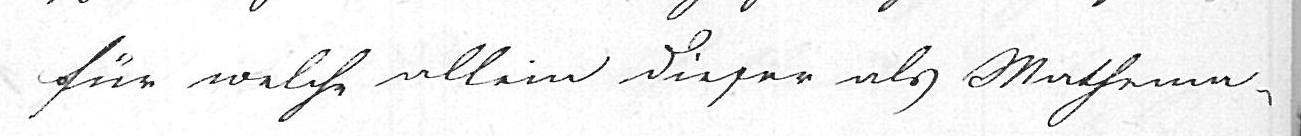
für welche allein dieser als Mathema-
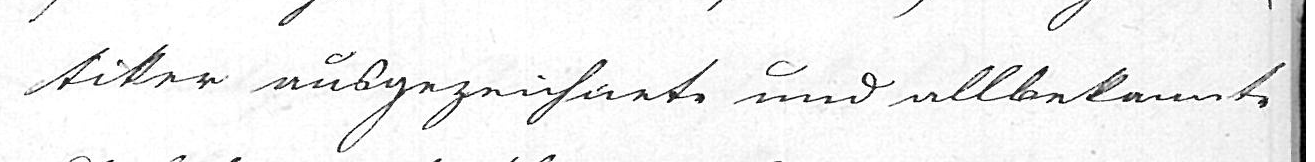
tiker ausgezeichnete und allbekannte
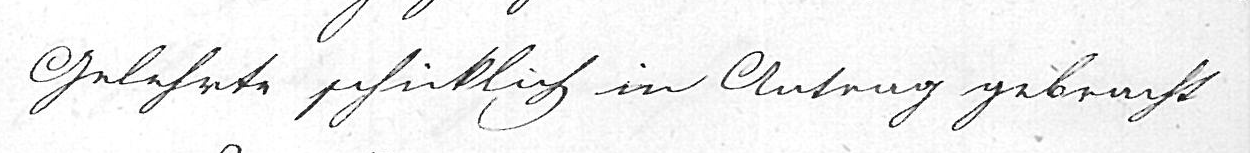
Gelehrte schicklich in Antrag gebracht
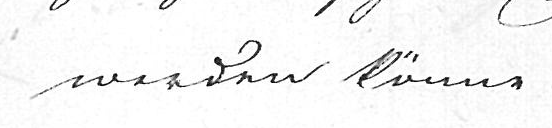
werden könne.
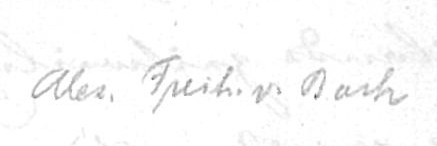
Alex. Freih. v. Bach
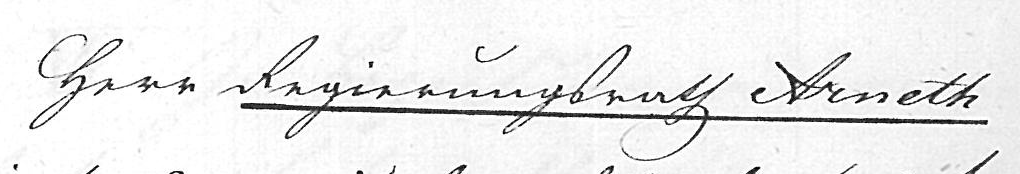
Herr Regierungsrath Arneth
